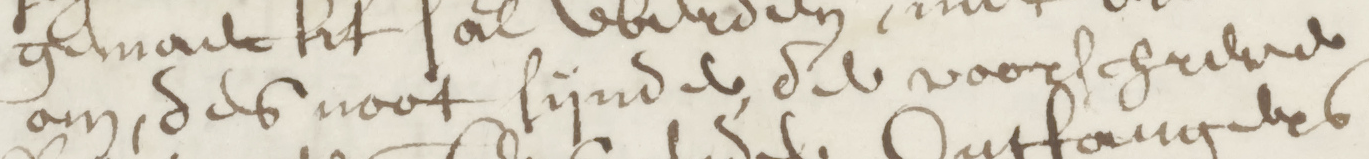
om, des noot sijnde, de voorschreve
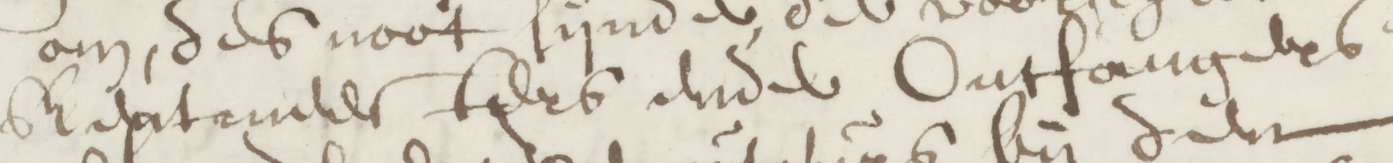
Rentmeesters ende Ontfangers
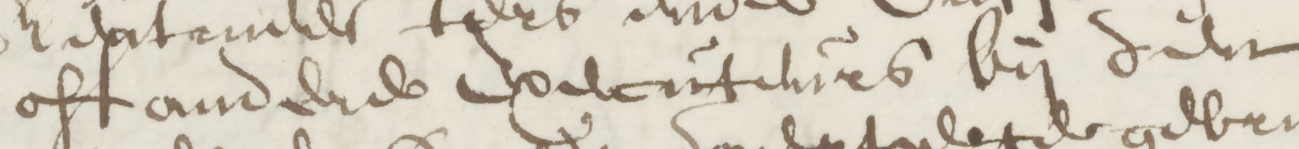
off andere Executeurs bij den
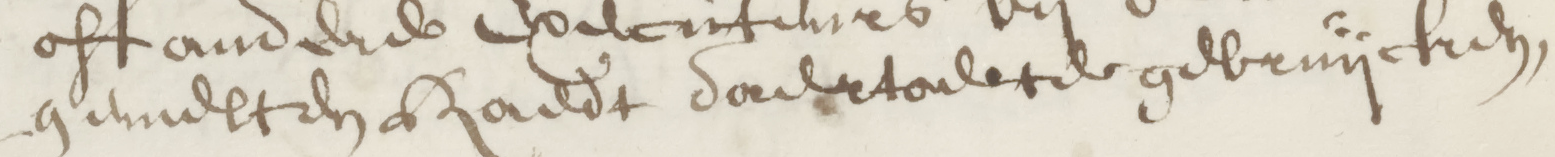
gemelten Raedt daertoe te gebruijcken,
